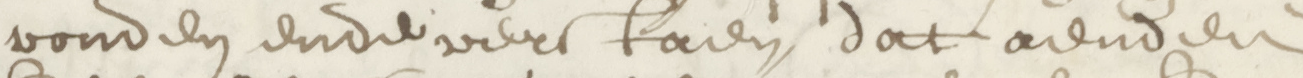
vonden ende verstaen, dat aenden
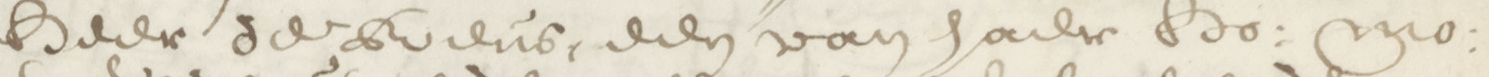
heer de Reus, een van haer Ho:Mo:
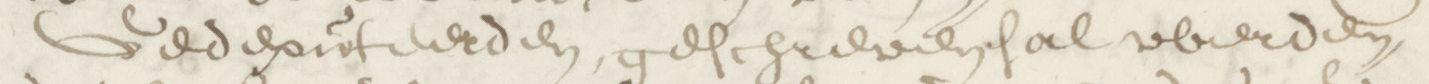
Gedeputeerden, geschreven sal werden,
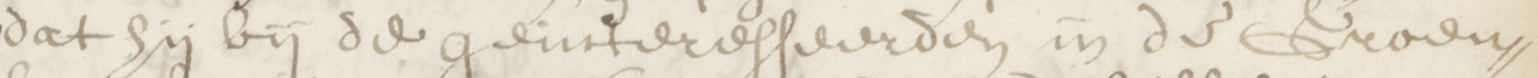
dat hij bij de geinteresseerden in de Groen,,
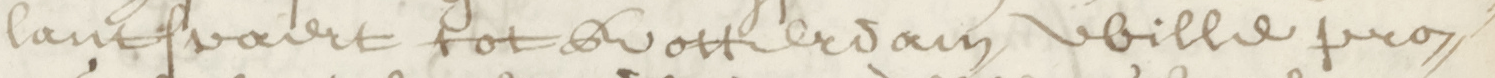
lantsvaert tot Rotterdam, wille pro,,
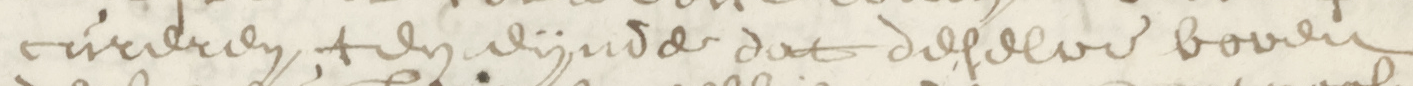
cureren, ten eijnde dat deselve boven
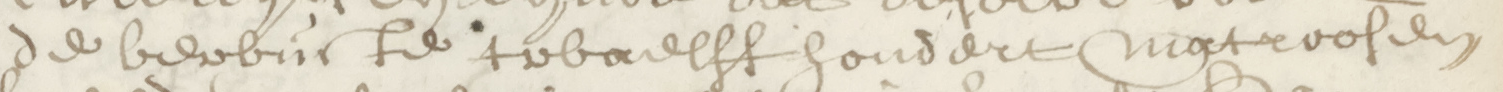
de bewuste twaelff hondert matroosen,
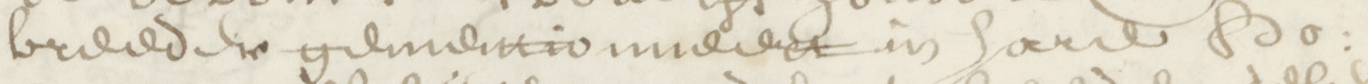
breeder gementionneert in hare Ho:
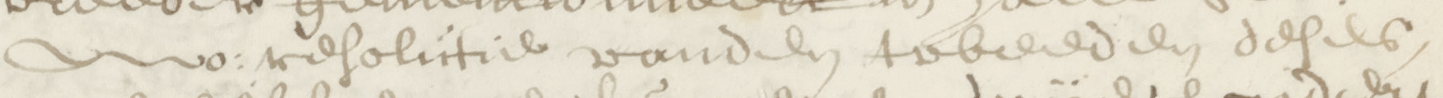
Mo: resolutie vanden tweeden deses,
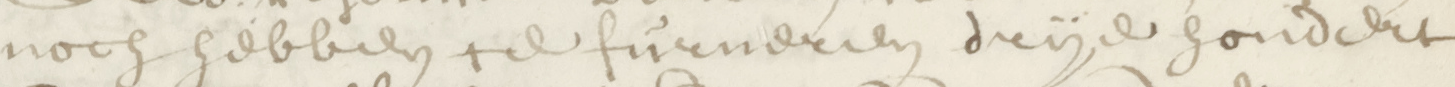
noch hebben te furneren drije hondert
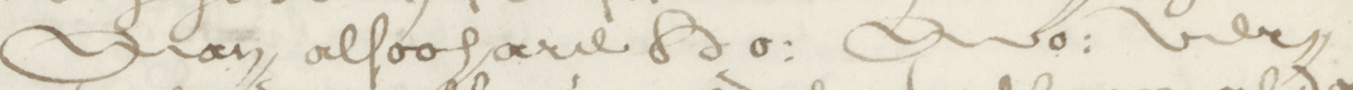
Man, alsoo hare Ho:Mo: ver,,
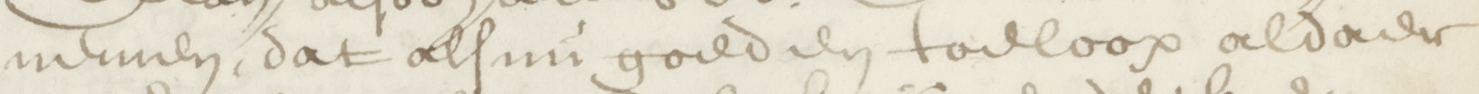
nemen, dat alsnu goeden toeloop aldaer
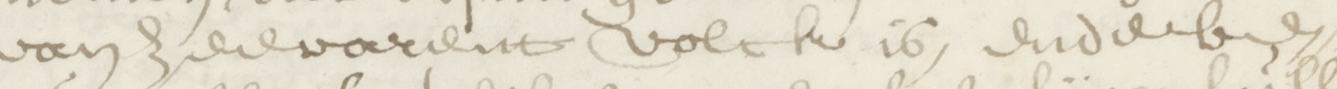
van zeevarent volck is, ende be,,
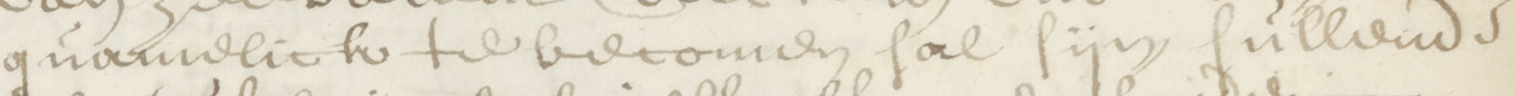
quamelick te becomen sal sijn, sullende
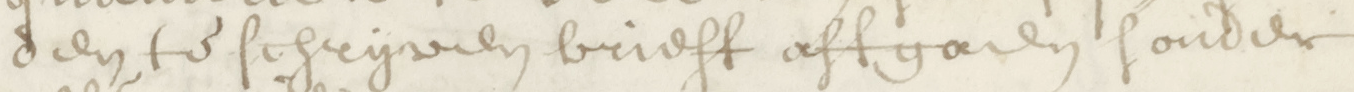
den te schrijven brieff affgaen sonder
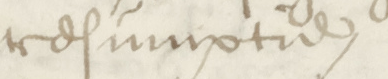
resumptie.
